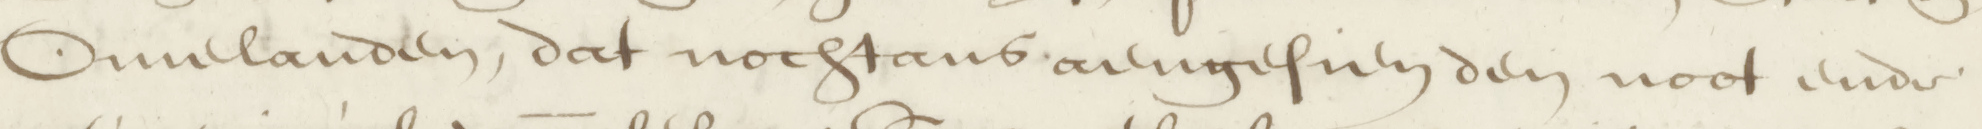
Omelanden, dat nochtans aengesien den noot ende
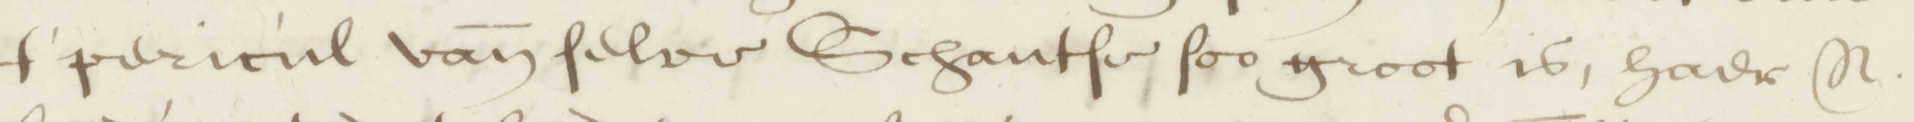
t'pericul van selve Schantse soo groot is, haer E.
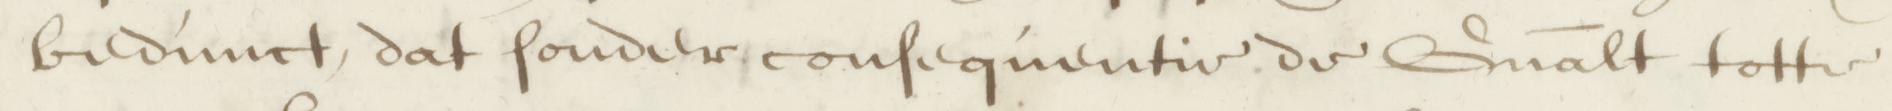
bedunct, dat sonder consequentie de Gnalt totte
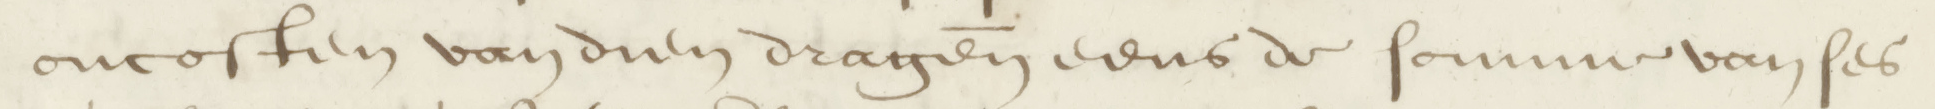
oncosten van dien dragen eens de somme van ses
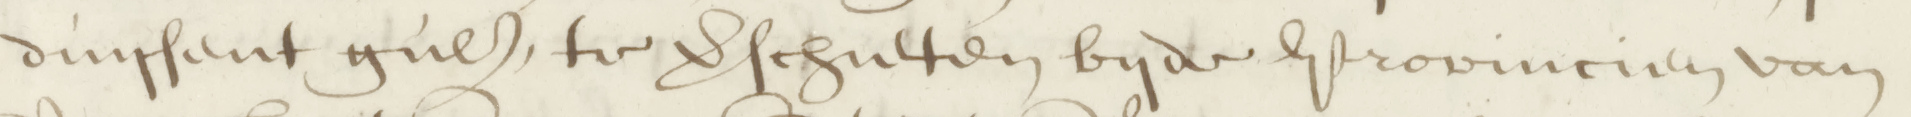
duysent gul, te vschulten byde provincien van
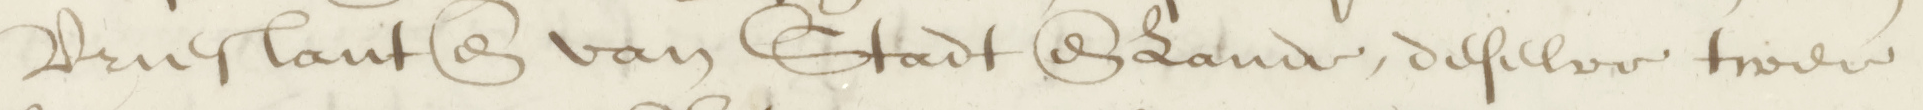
Vrieslant & van Stadt & Lande, deselve twee
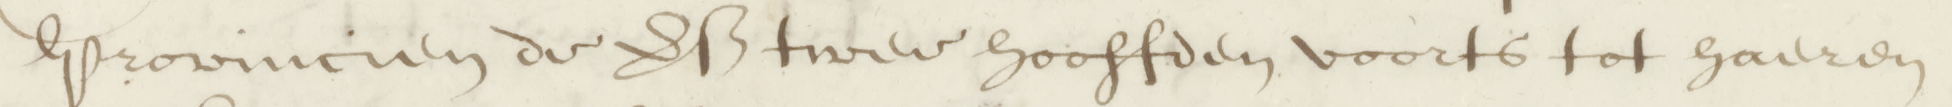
provincien de vs twee hooffden voorts tot haeren
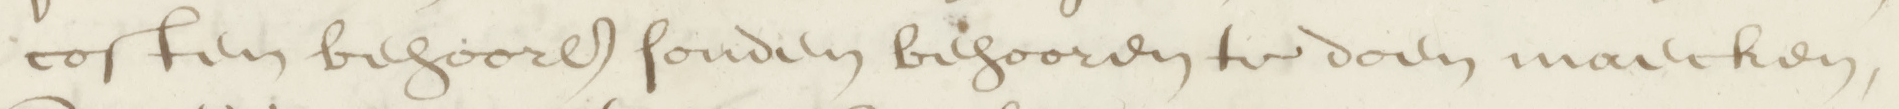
costen behoorl souden behooren te doen maecken,
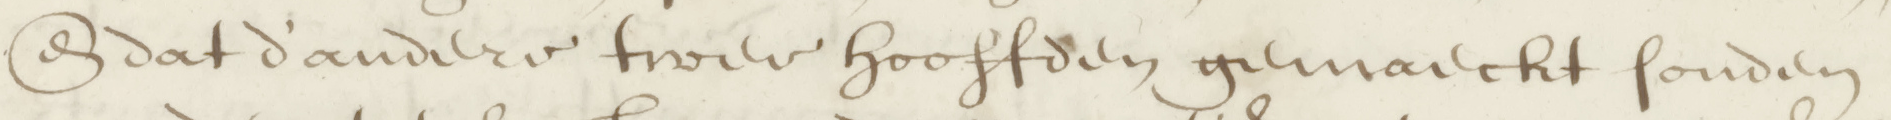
& dat d'andere twee hooffden gemaeckt souden
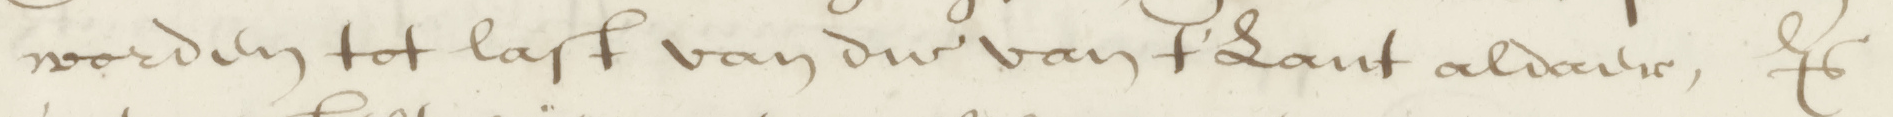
worden tot last van die van t'Lant aldaer. Is
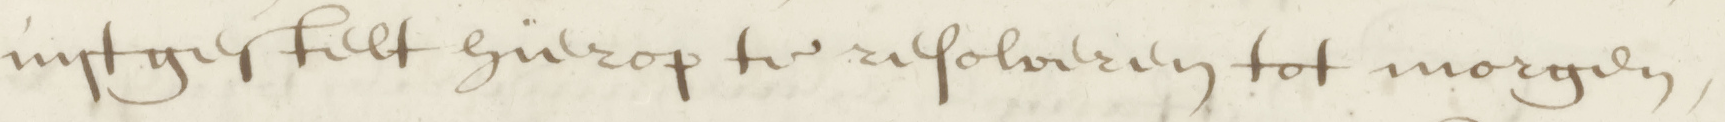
uytgestelt hierop te resolveren tot morgen.
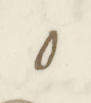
o
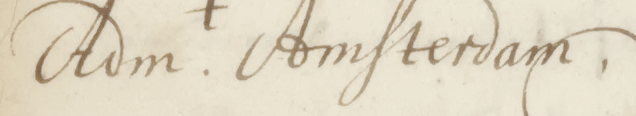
Admt. Amsterdam
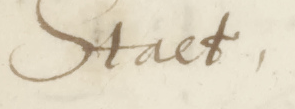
Staet.
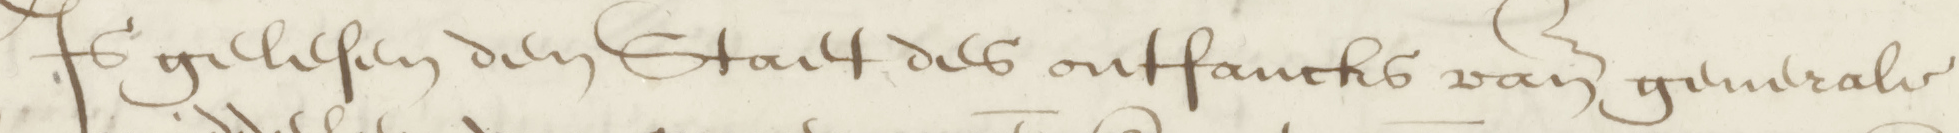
Is gelesen den Staet des ontfancks van generale
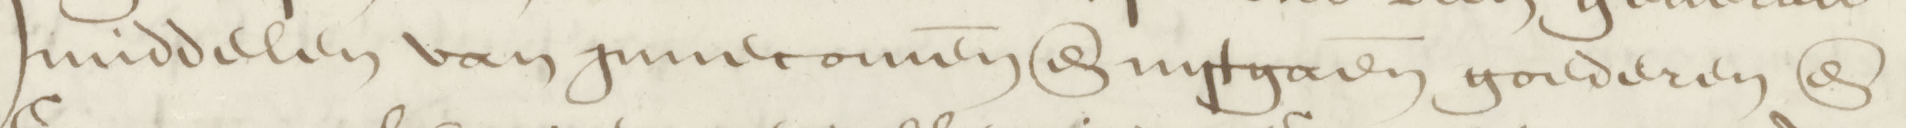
middelen van Innecomen & uytgaen goederen &
